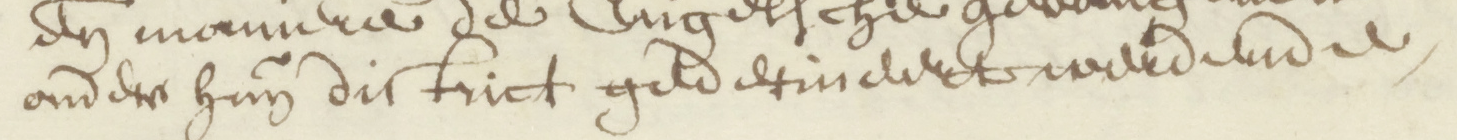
onder hun district gedetineert werdende
